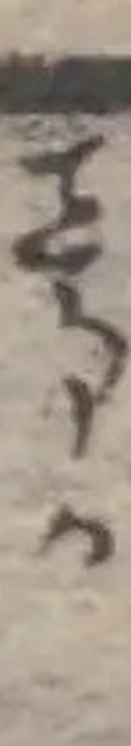こと事か
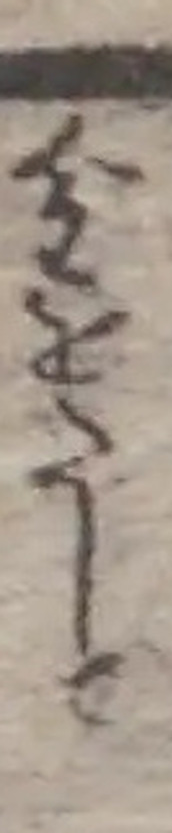金をたして
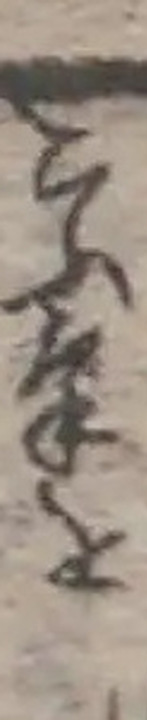こふ気を
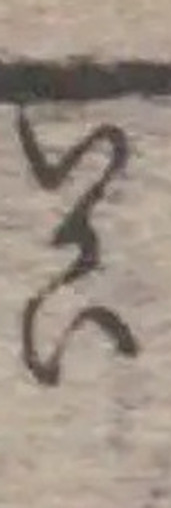いかい
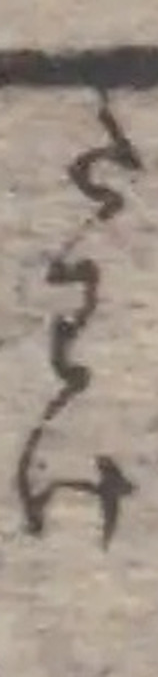たわけ

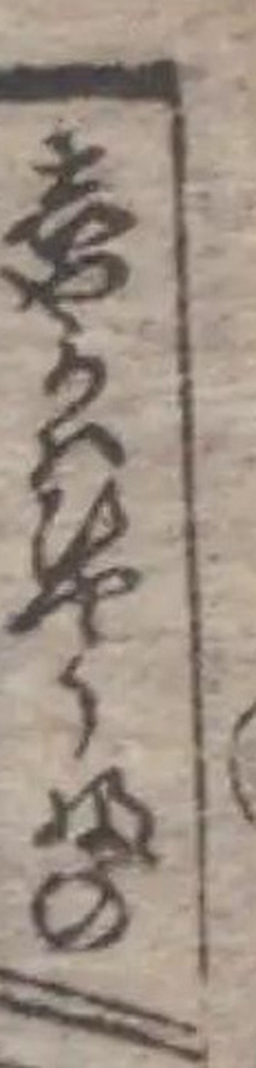しやかはひやうふの
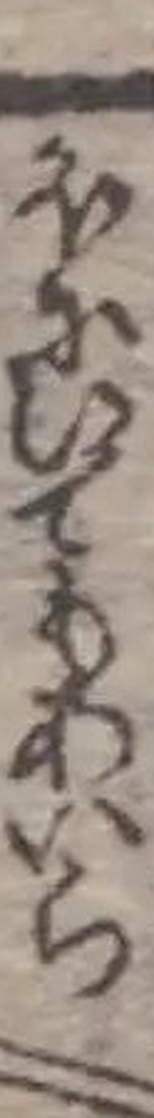外にいてもあいら
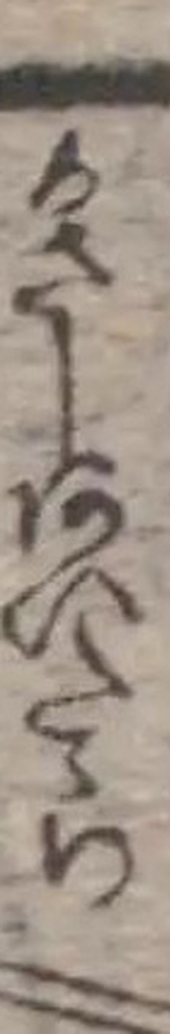かさしあいたら
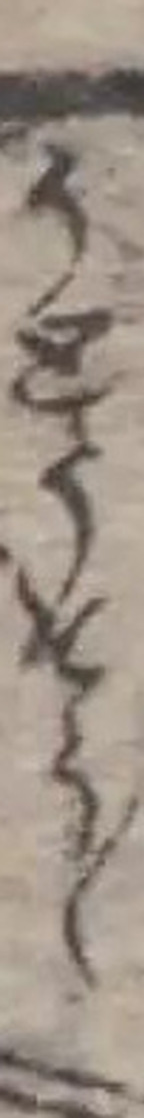うとうそう〳〵
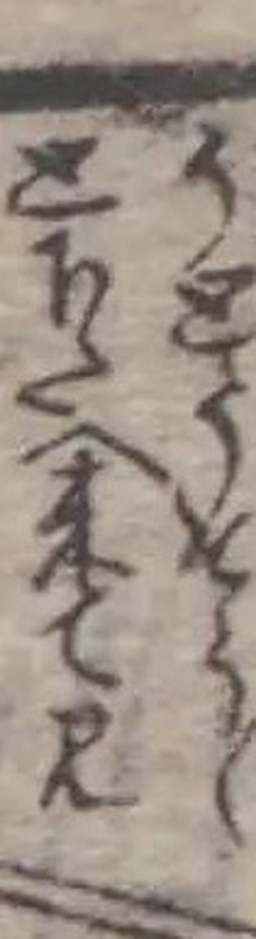と下たへ来て見
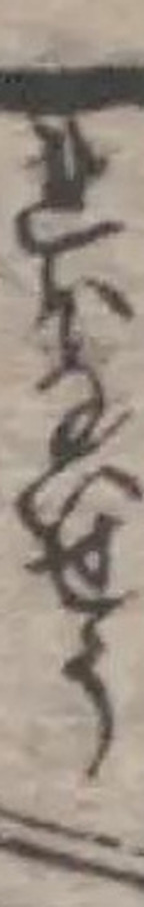れはないせう
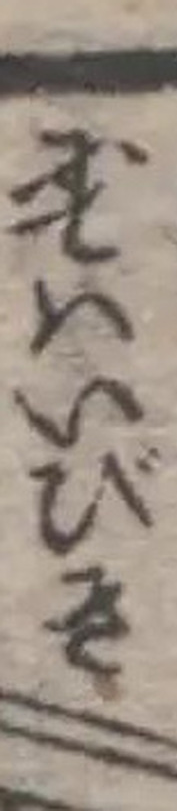にてはいびき
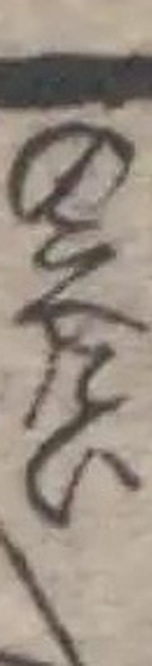のこへたい
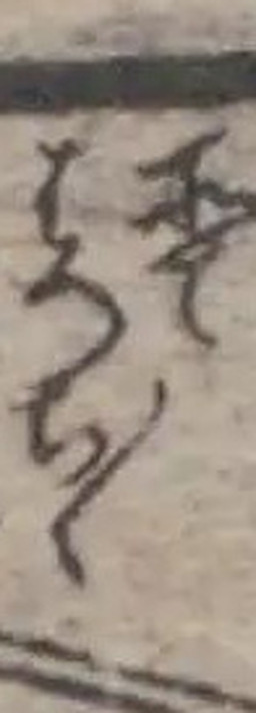はつち〳〵
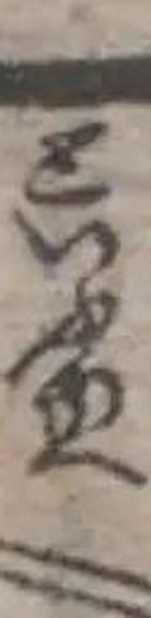といふゆへ
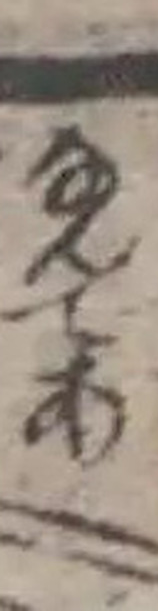なんてあ
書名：早出来 3巻
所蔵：国立国会図書館 National Diet Library, JAPAN
